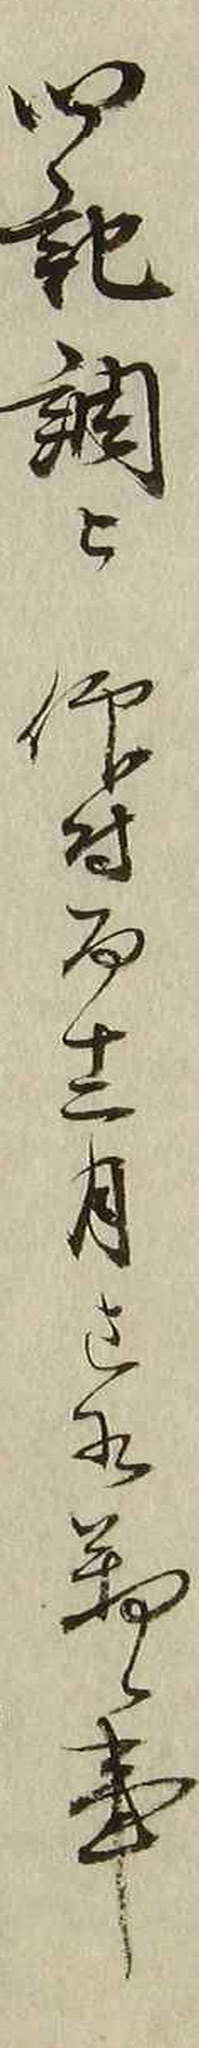旧記調被仰付酉十二月迄相勤候事
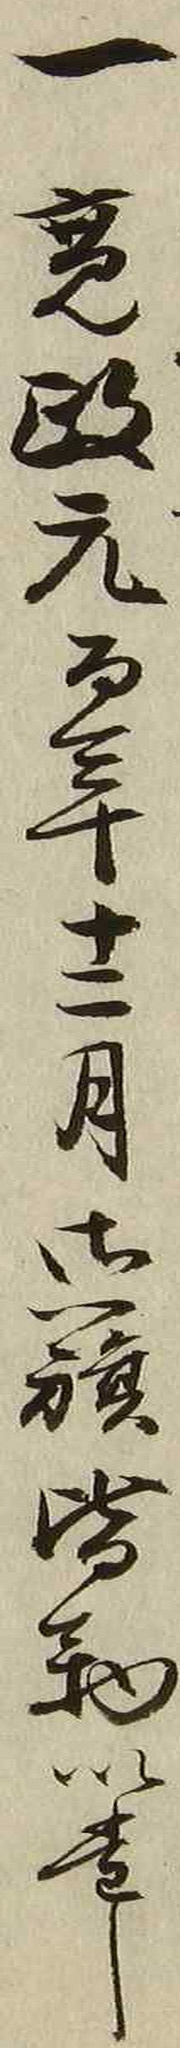一寛政元酉年十二月御旗皆勤いたし
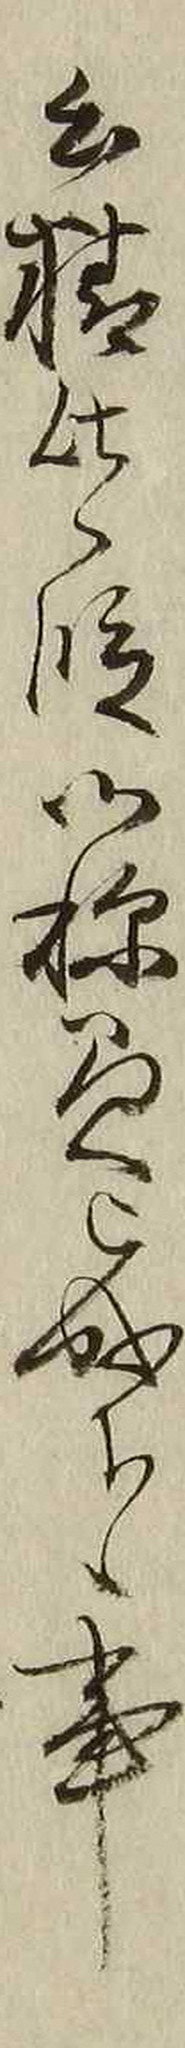出精仕候段御称美被成下候事
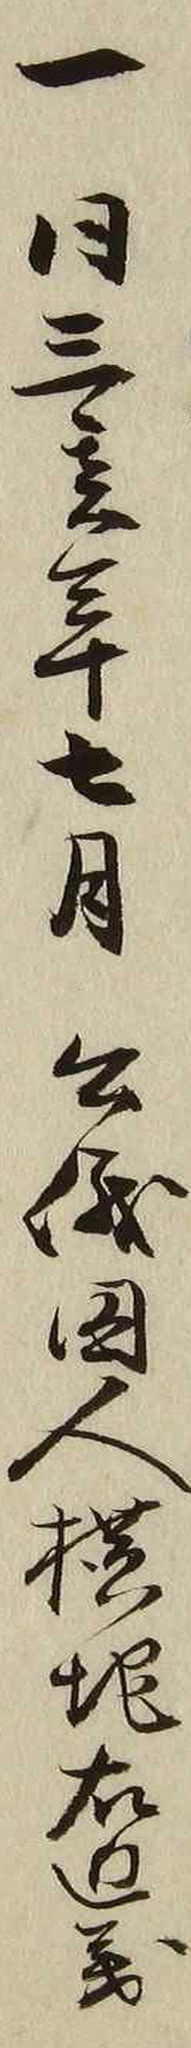一同三亥年七月公儀囚人横地右近義
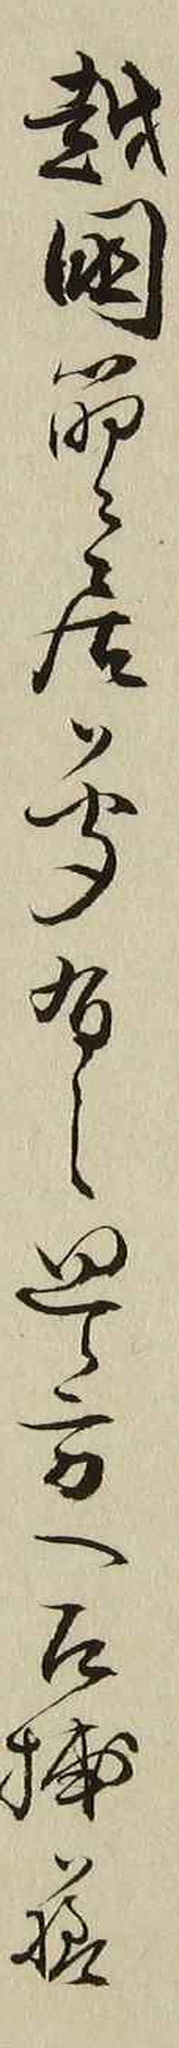越国筋ニ居候聞有之廻り方へ召捕候様
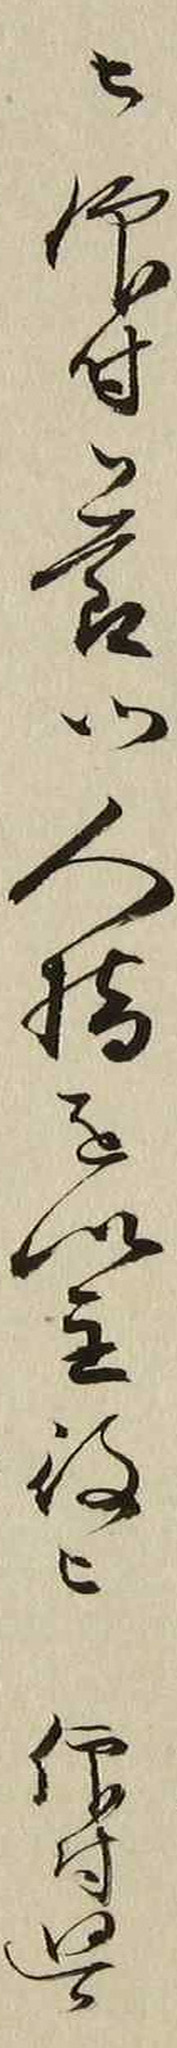被仰付候節御人指を以主役被仰付廻り
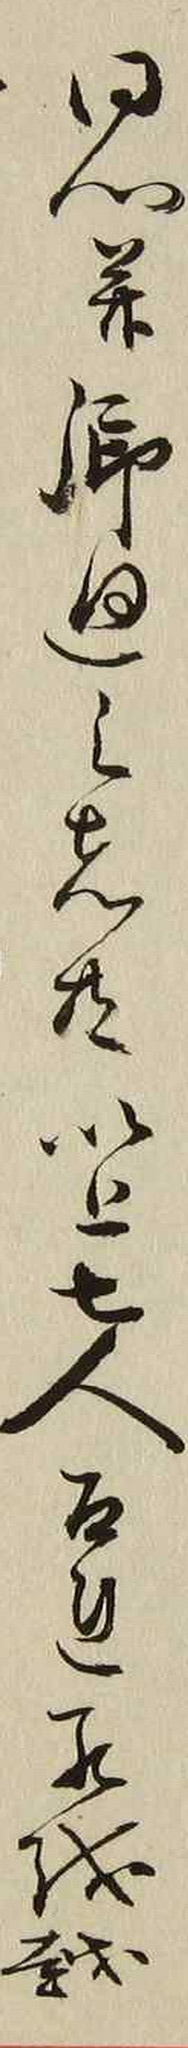同心并郷廻之者共以上七人召連罷越越
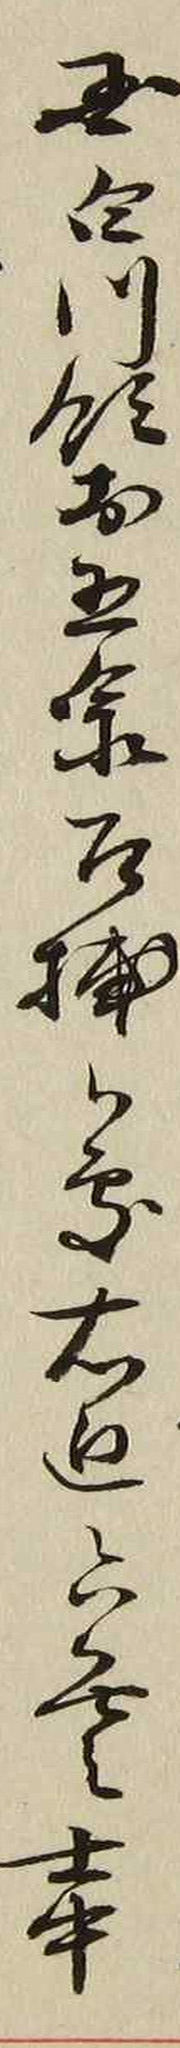国白川領於五泉召捕候処右近ニハ無之士中
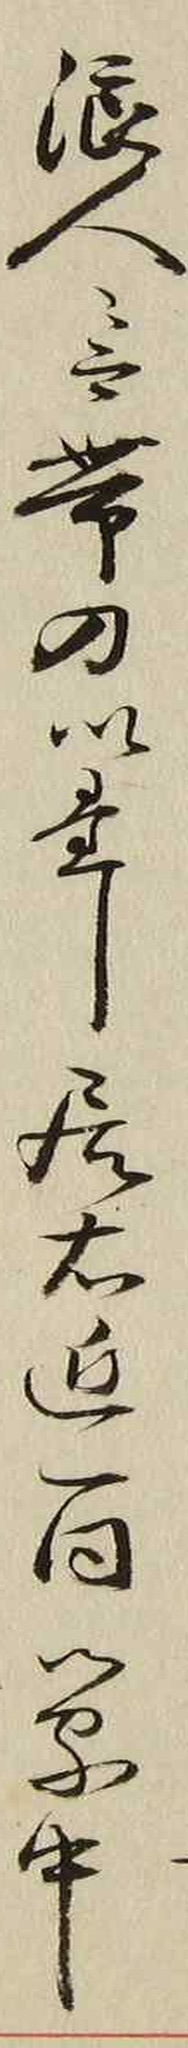浪人ニ而帯刀いたし居右近一同御家中
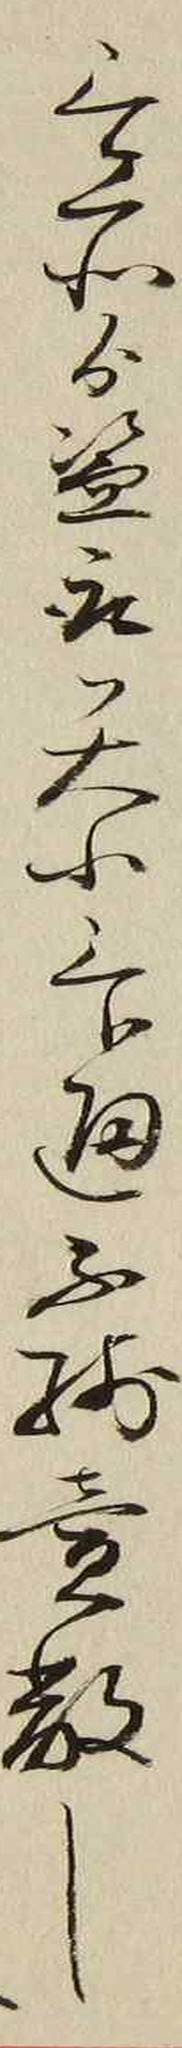三ヶ所ゟ盗取候大小三ヶ通不残売散し
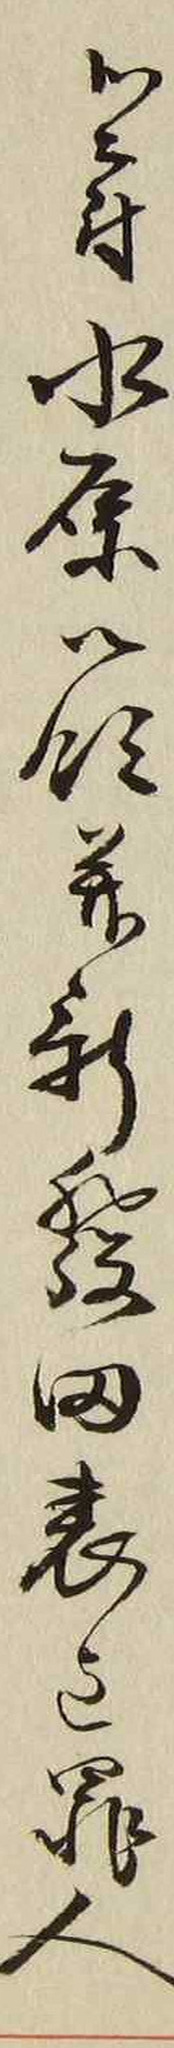候ニ付水原御領并新発田表迄罪人
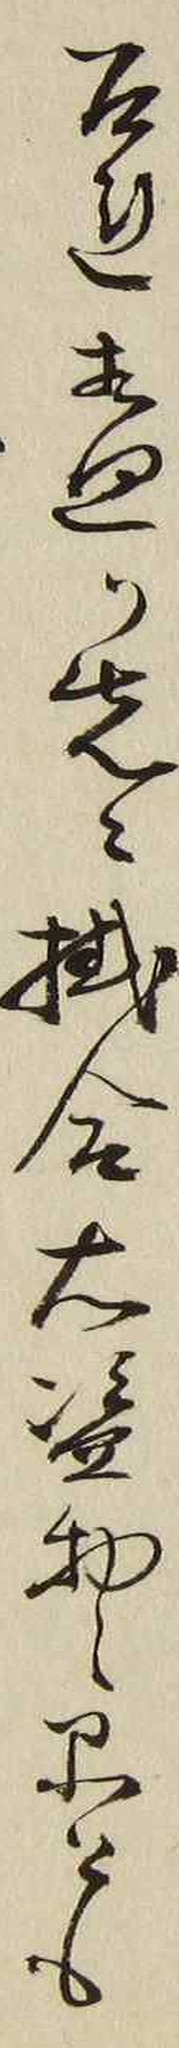召連相廻り先ニ掛合右盗物之品とも
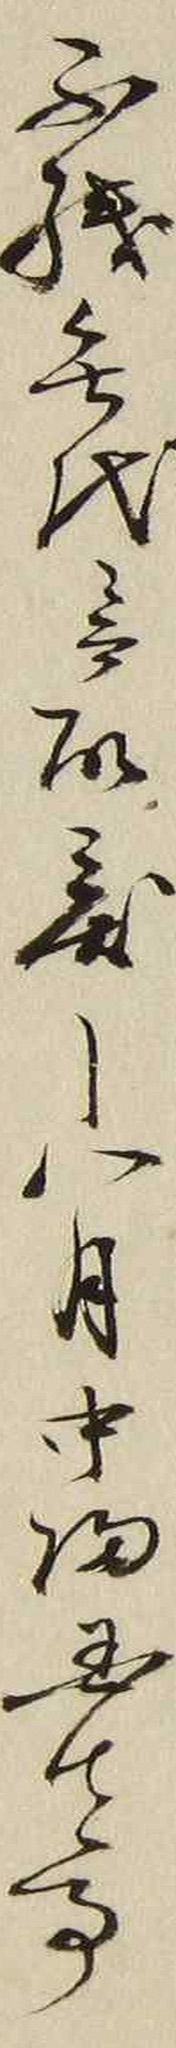不残無代ニ而取戻し八月中帰国仕候事
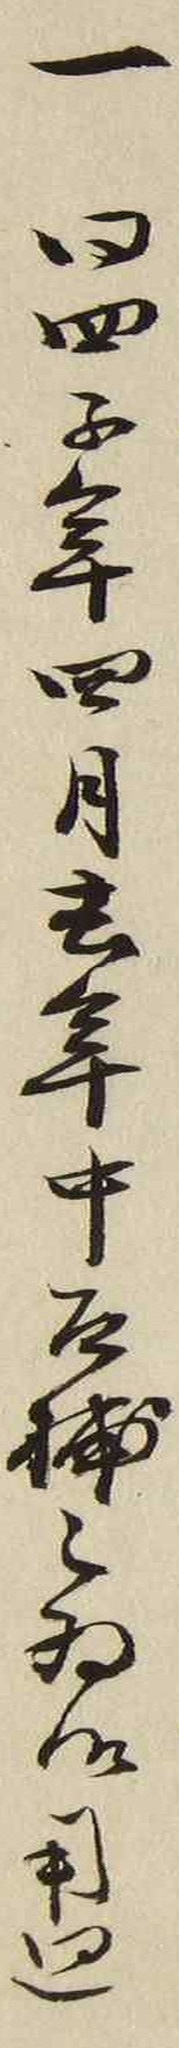一同四子年四月去年中召捕之為御用廻

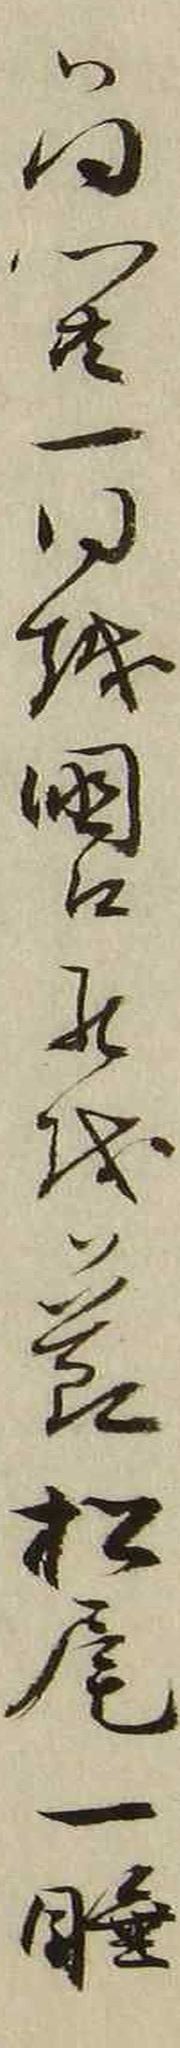り同心共一同越国江罷越候節松尾一睡
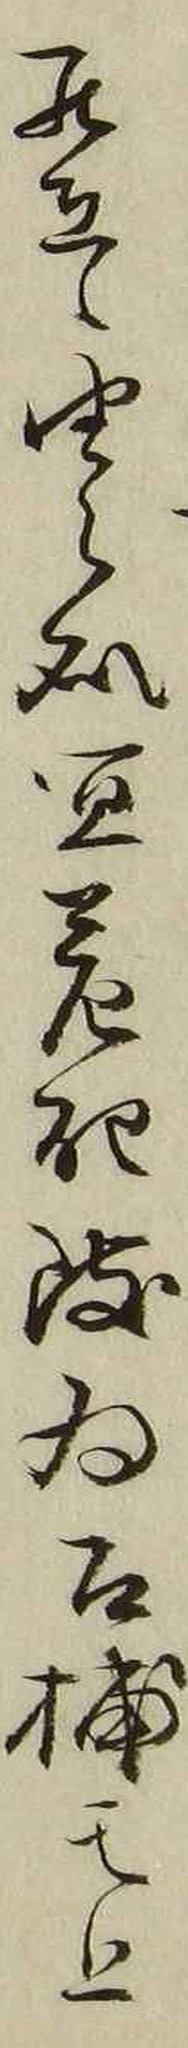罷在候由之処宜差配致為召捕其上
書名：諸士系譜　巻之291　さ之部23
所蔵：会津若松市立会津図書館
